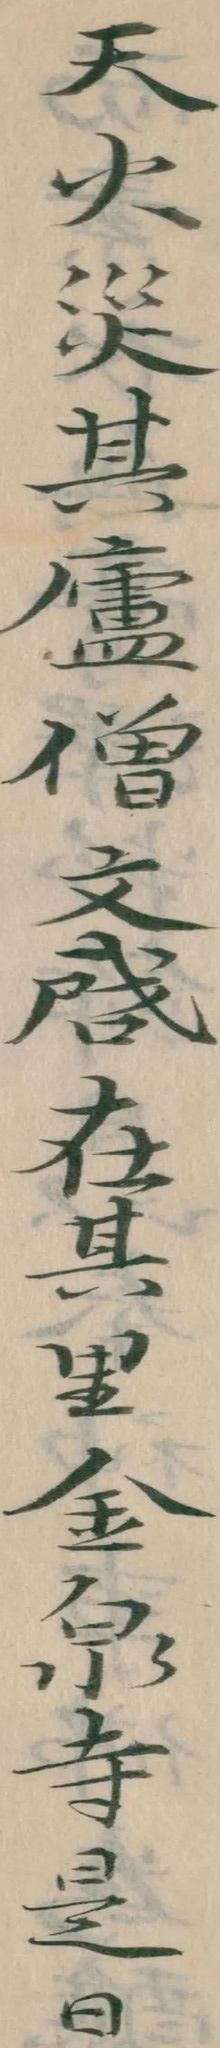天火災其廬僧文啔在其里金泉寺是日
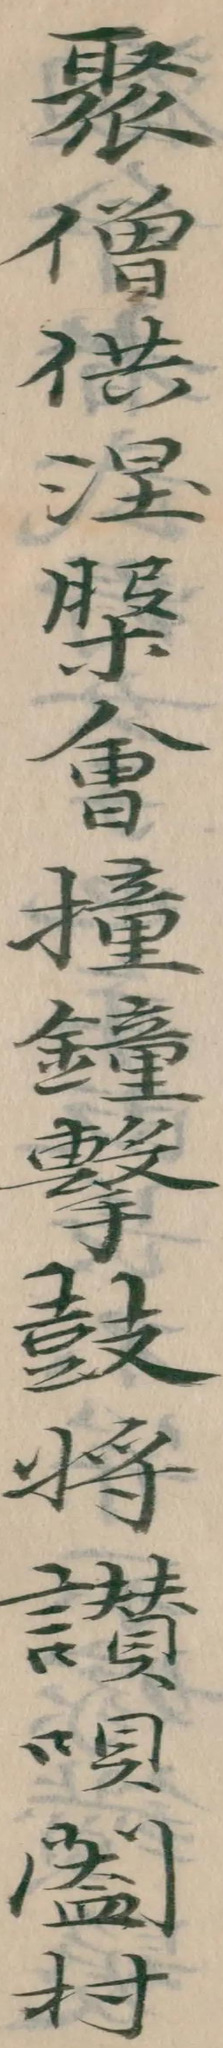聚僧供涅会撞鐘撃鼓将讃唄闔村
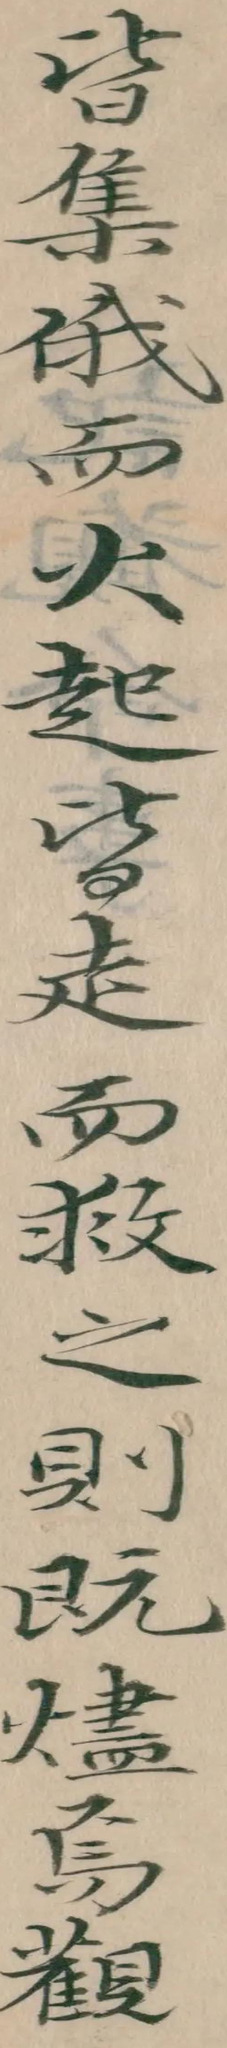皆集俄而火起皆走而救之既燼観
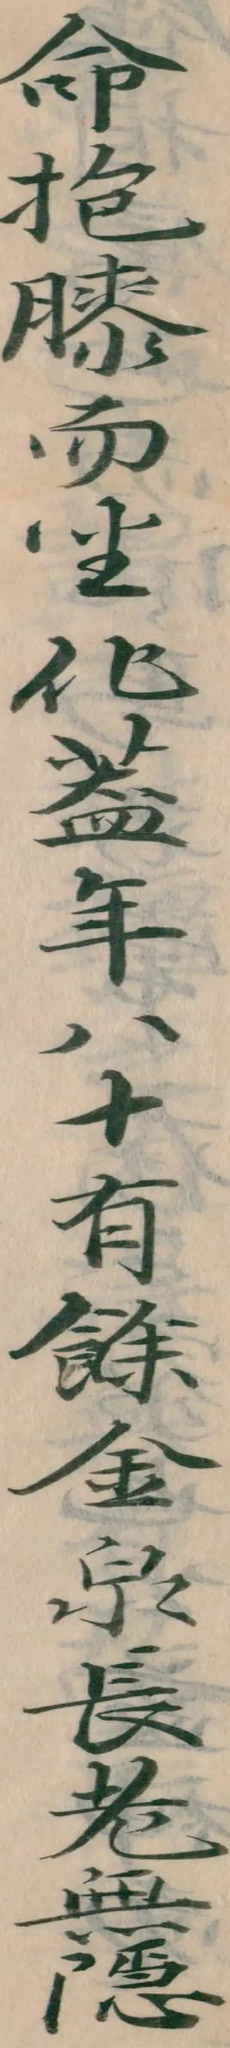命抱膝而坐化蓋年八十有余金泉長老無隠
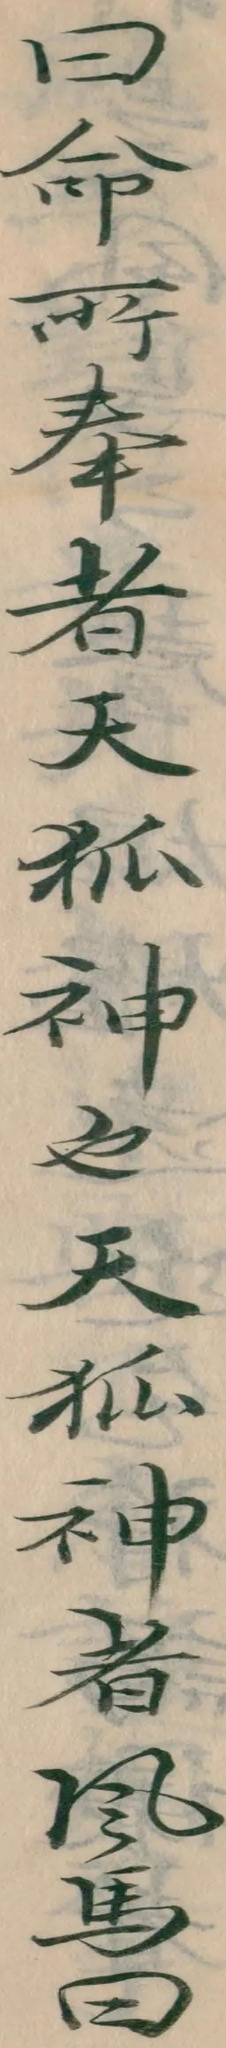曰命所奉者天狐神也天狐神者風馬曰
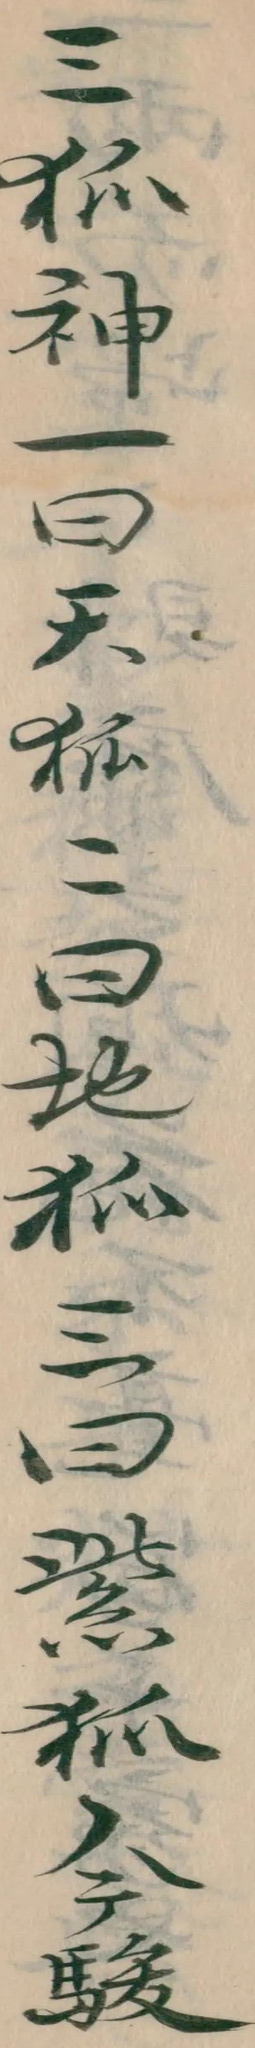三狐神一曰天狐二曰地狐三曰紫狐今駿
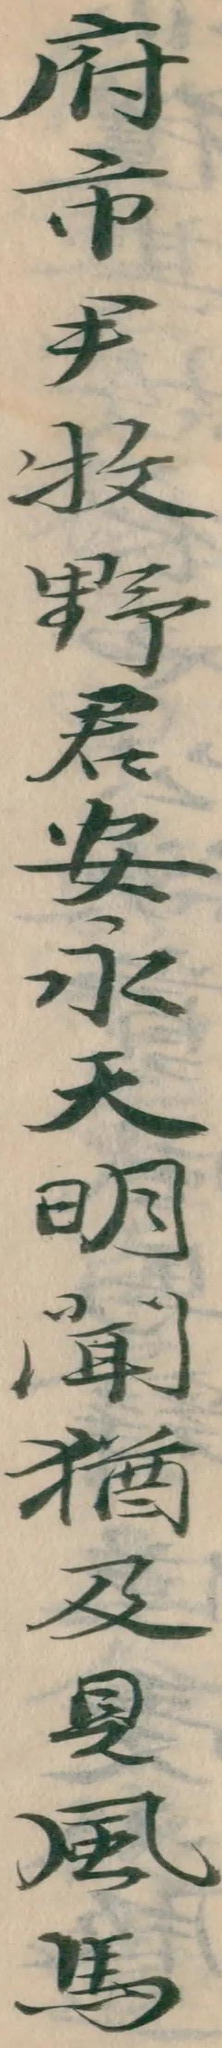府市尹牧野君安永天明聞猶見風馬
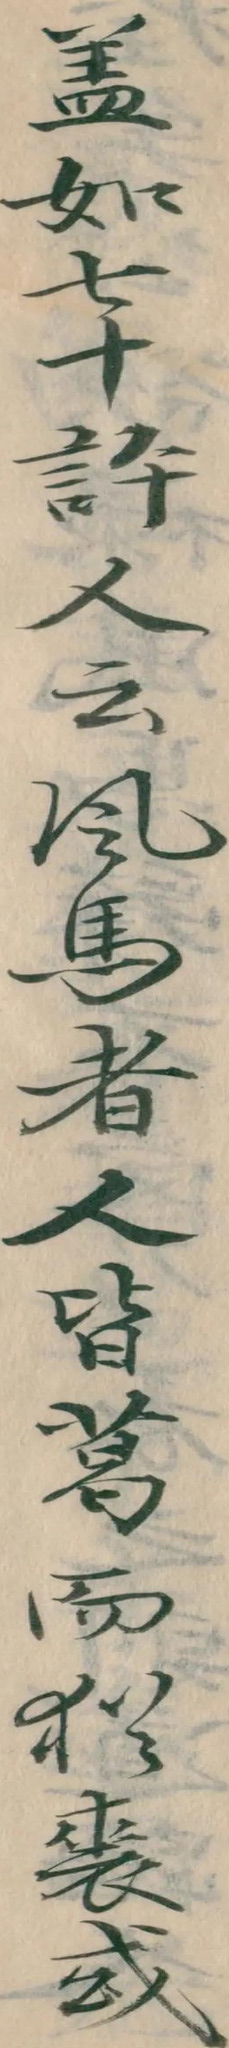蓋如七十許人云風馬者人皆葛而貂裘或
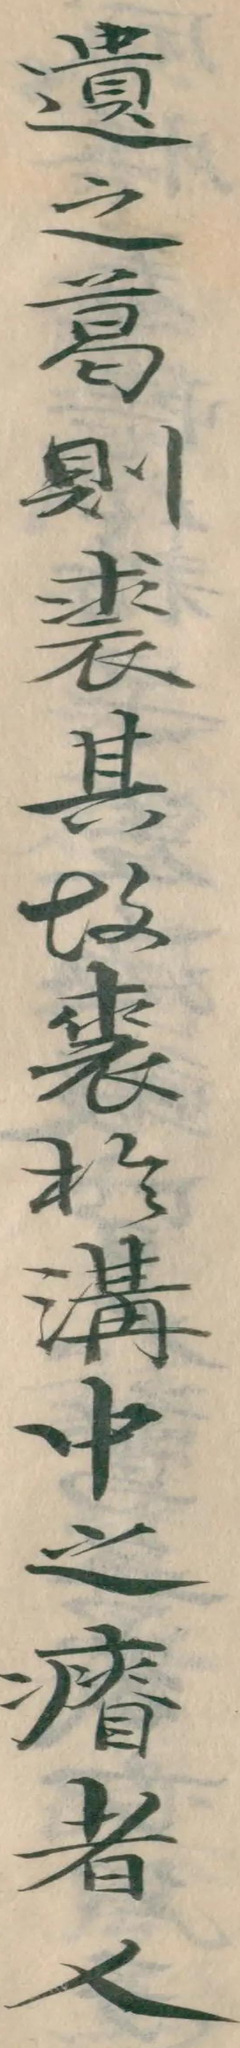遺之葛則裘其坂裘於溝中之者人
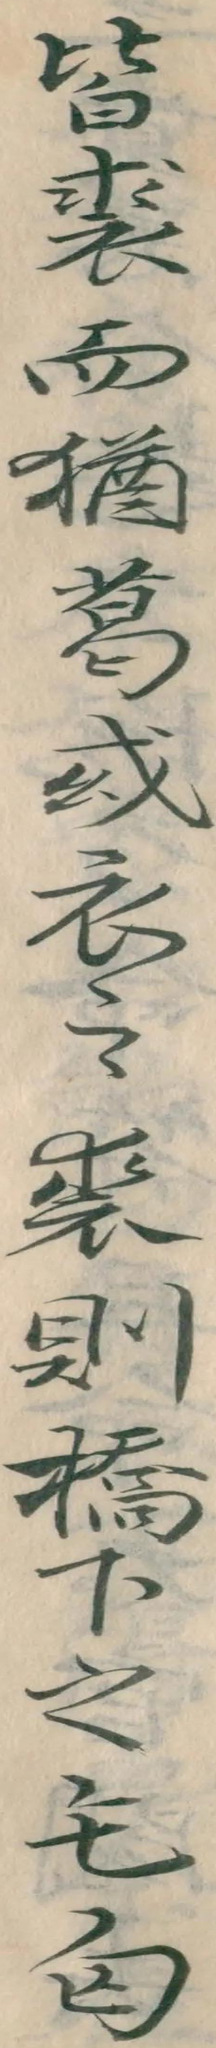皆裘而猶葛或衣之裘則橋下之匃
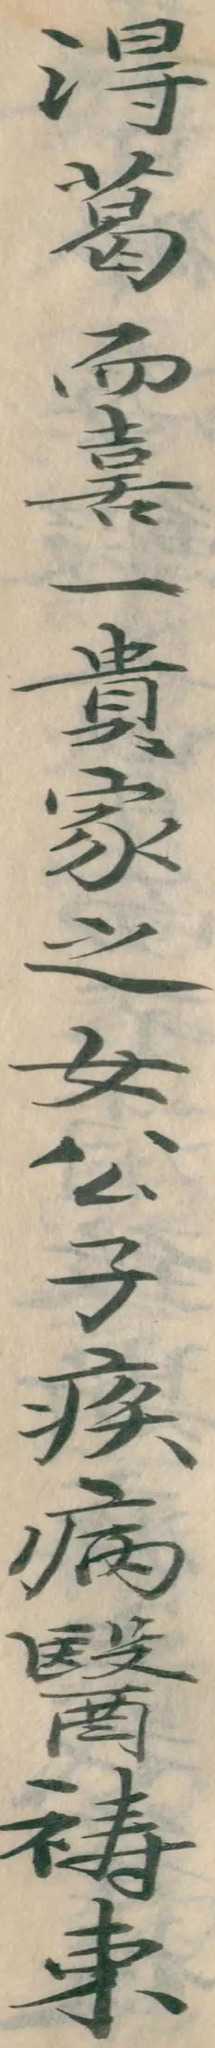得葛而喜一貴家之女公子疾病医祷束
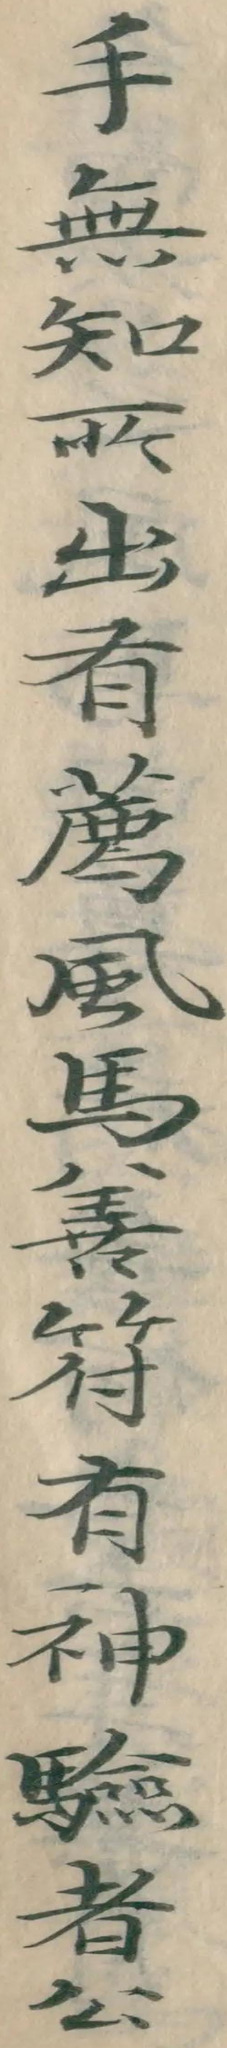手無知所出者薦風馬ハ符有神験者公

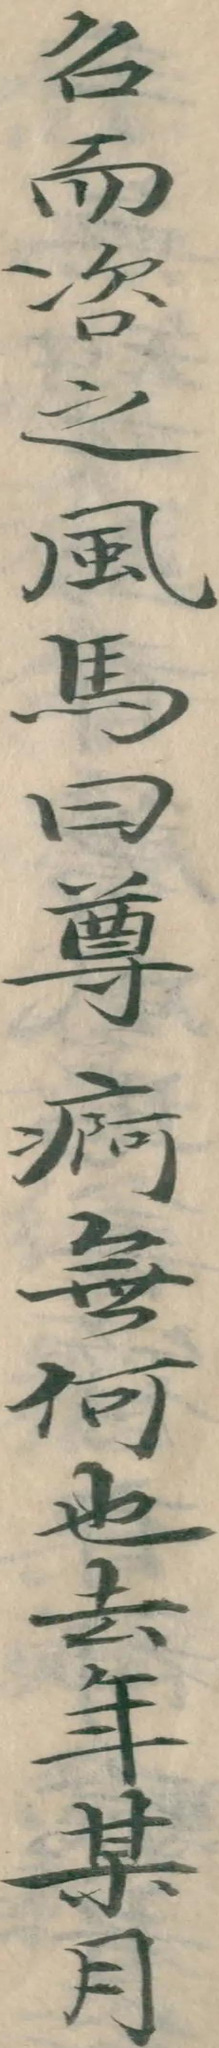召而咨之風馬曰尊痾無何也去年某月
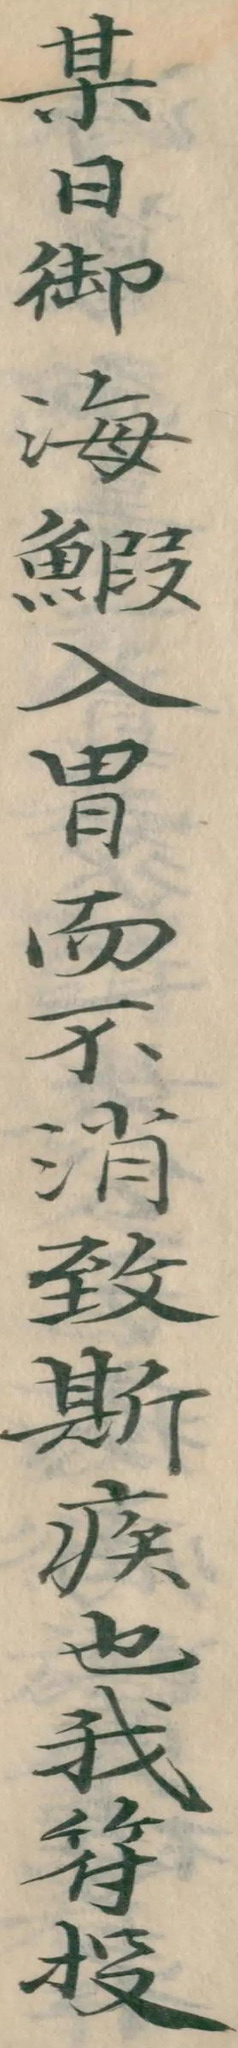某日御海鰕入胃而不消致斯疾也我符投
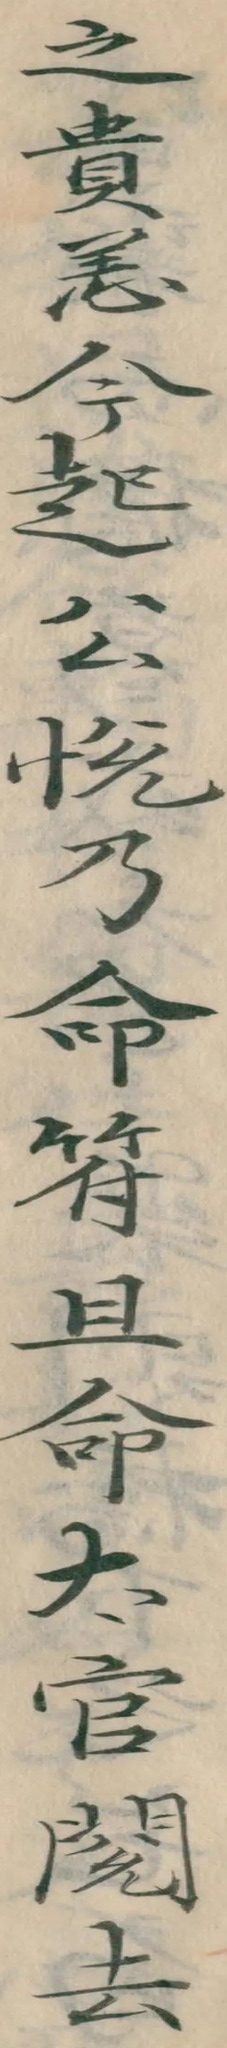之貴恙今起公悦乃命符且命太官閲去
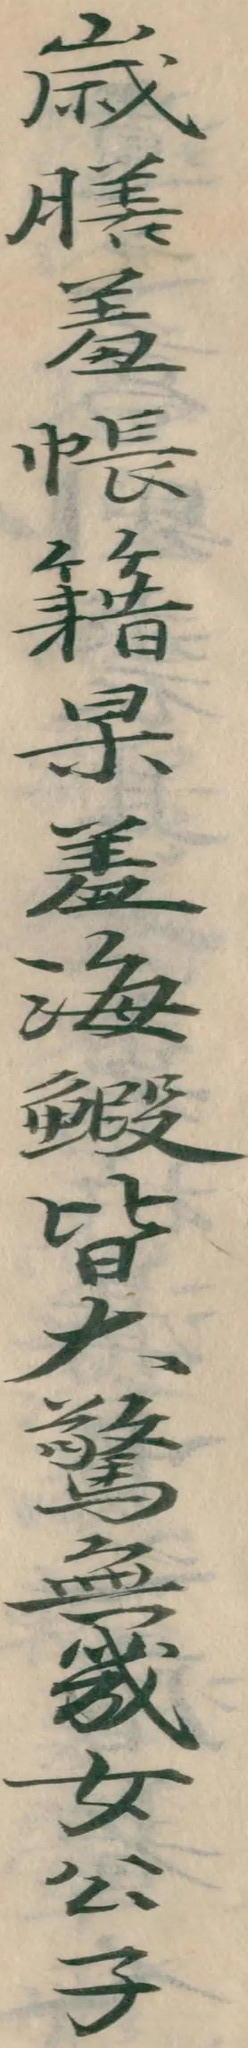歳膳羞帳籍羞杲羞海鰕皆大驚無女公子
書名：輪池叢書. 12
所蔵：国立国会図書館 National Diet Library, JAPAN
